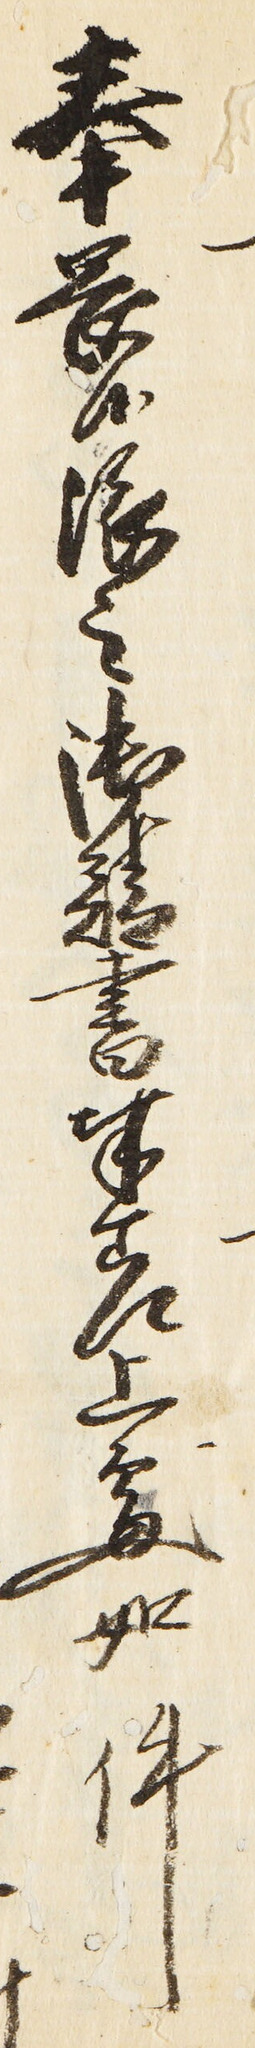奉畏候依之御請書奉差上処如件
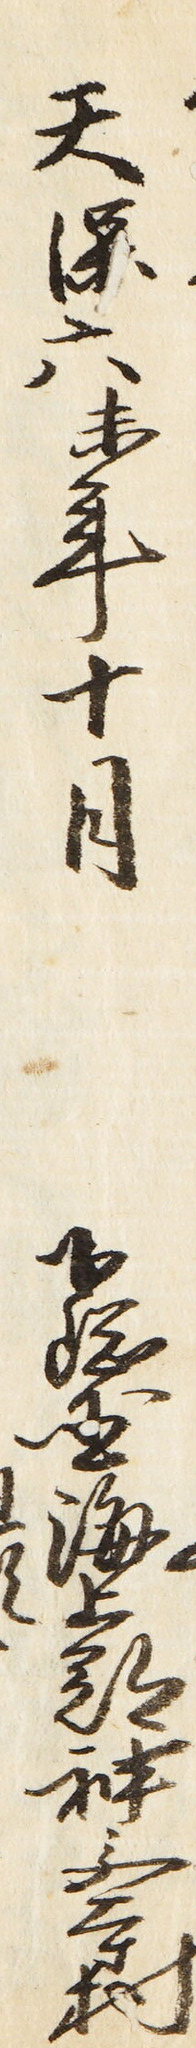天保六未年十月下総国海上郡神宮寺村
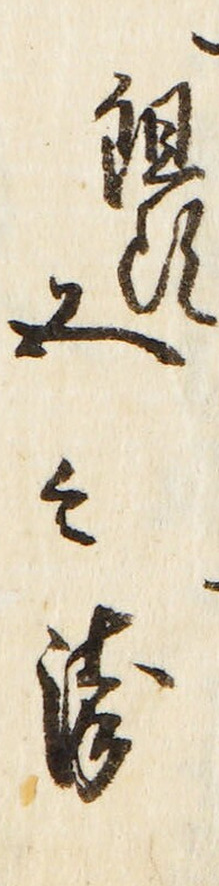組頭五兵衛
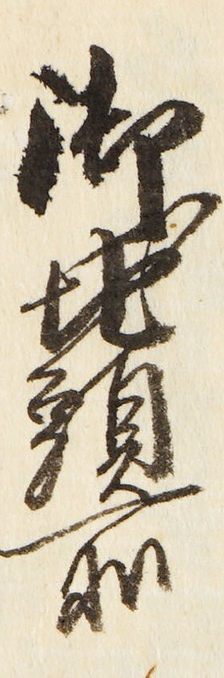御地頭所
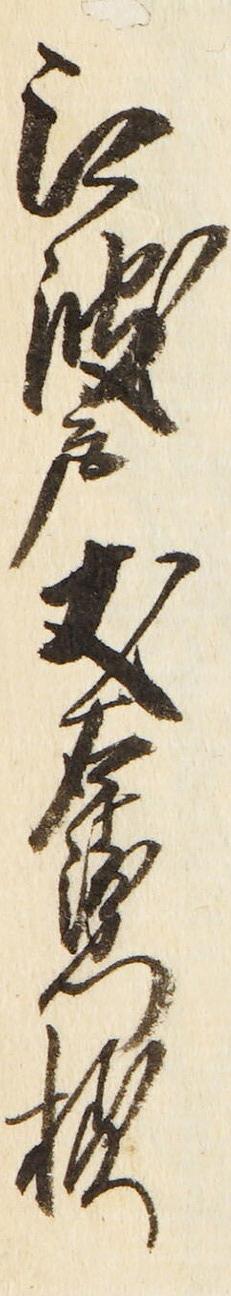江波戸丈右衛門様

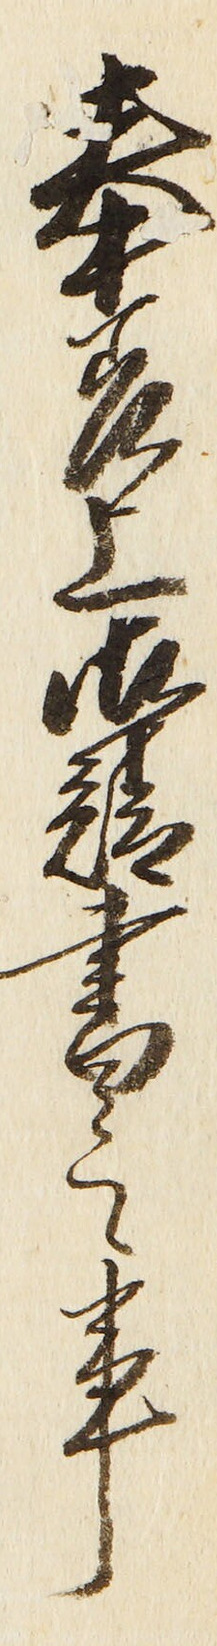奉差上御請書之事
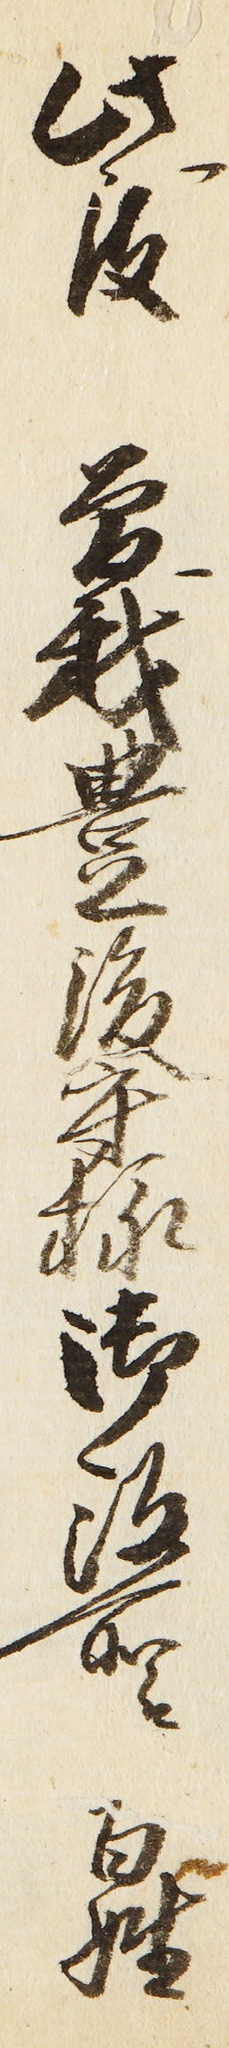此度曽我豊後守様御役所ニ百姓
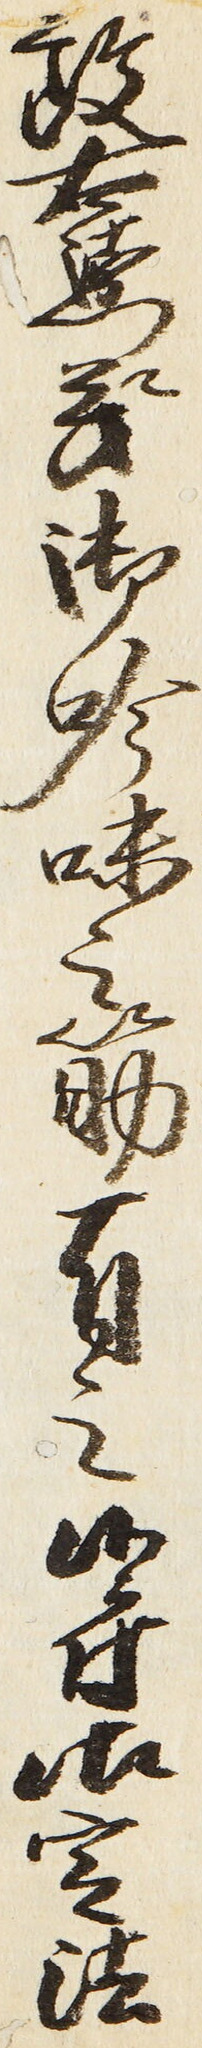政右衛門義御吟味之筋有之候ニ付御定法
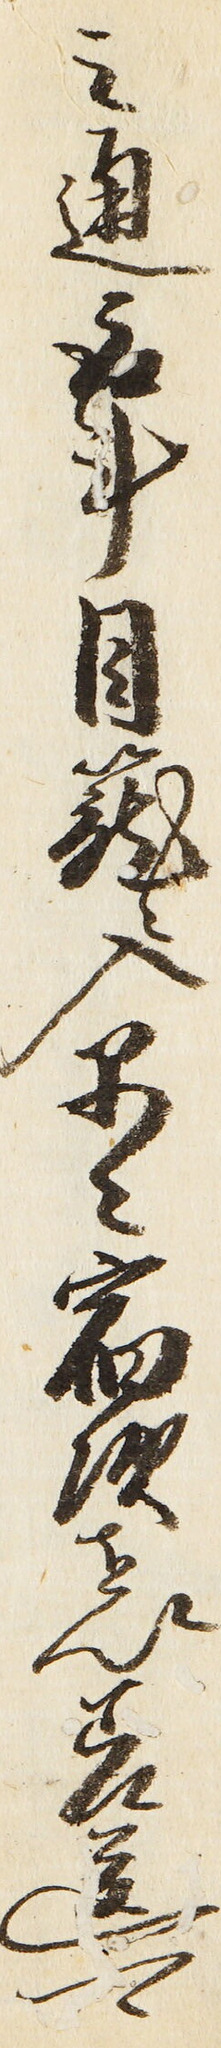之通取計目籠ニ入早々宿次を以差送可
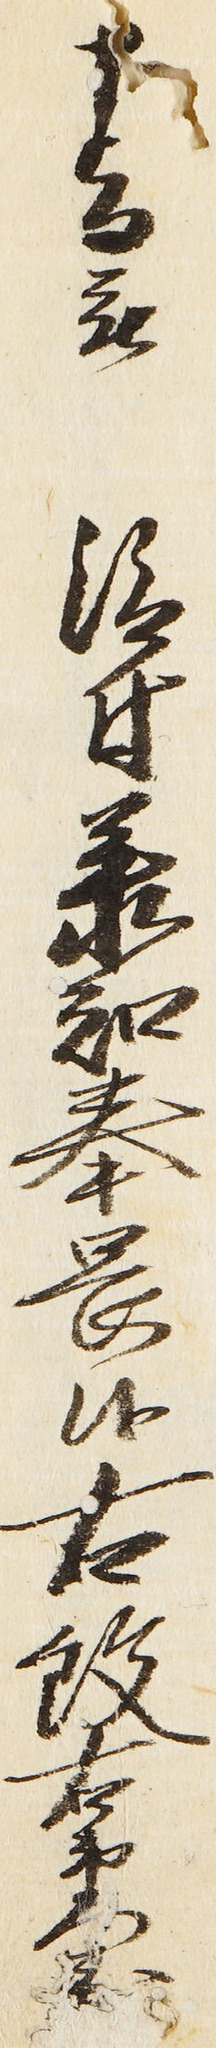申旨被仰付承知奉畏候右政右衛門義
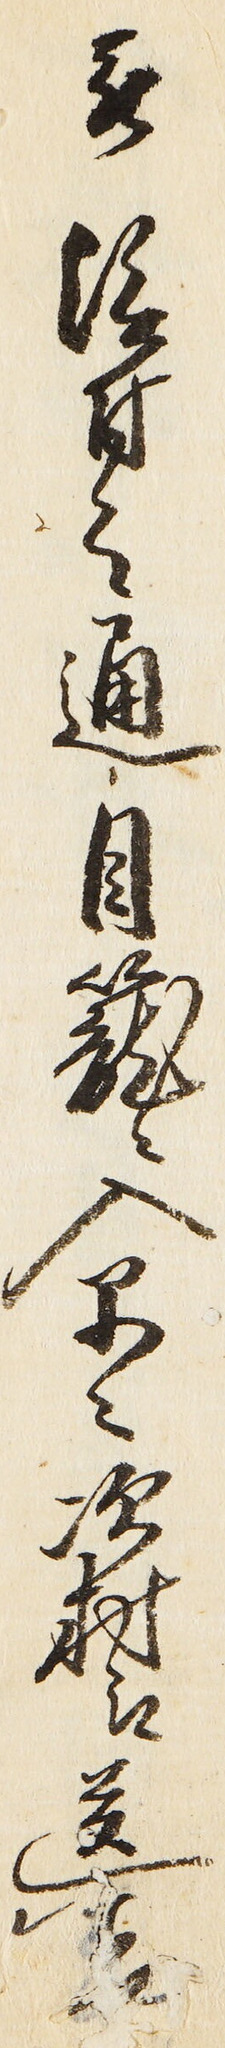被仰付之通目籠ニ入早々次村江送差
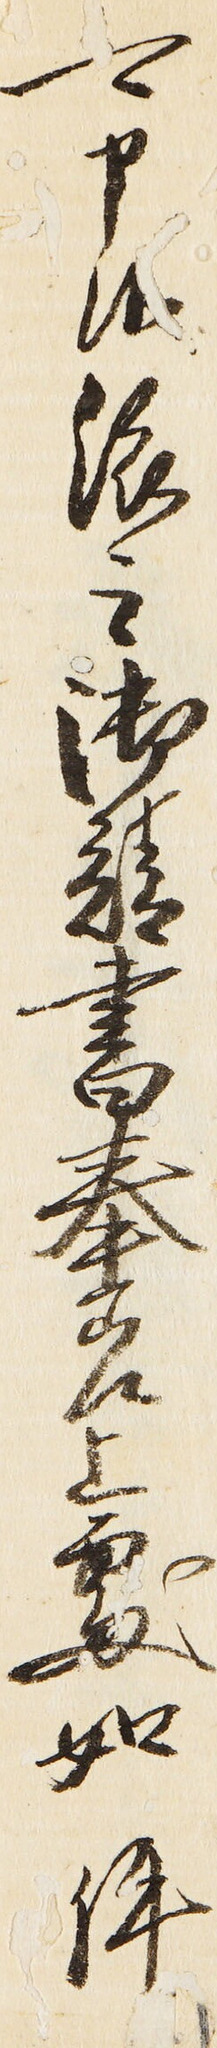可申候依之御請書奉差上処如件
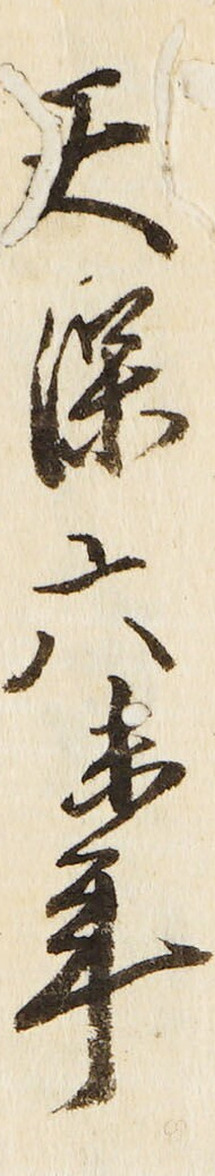天保六未年
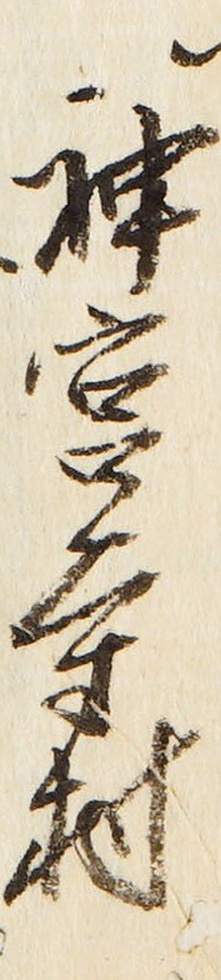神宮寺村
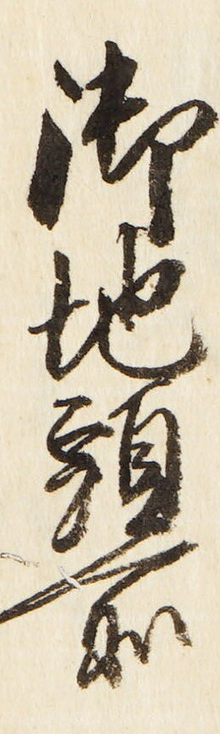御地頭所
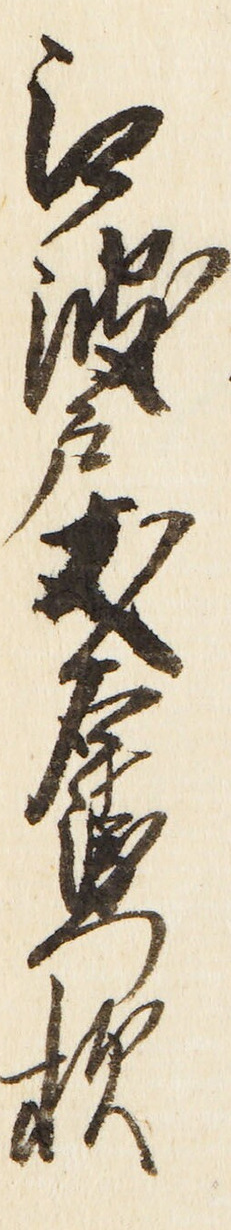江波戸丈右衛門
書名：難船一件記録
